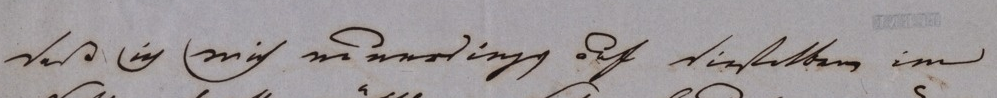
daß ich mich neuerdings auf dieselben im
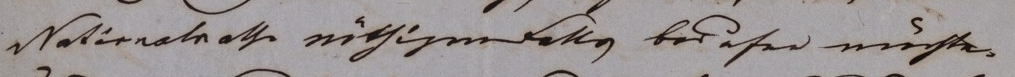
Nationalrathe nöthigen Falls berufen möchte.
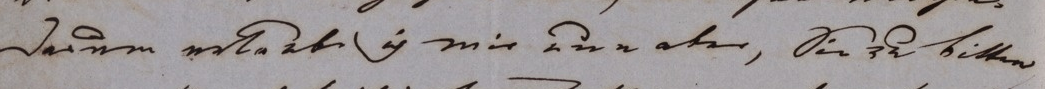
Darum erlaube ich mir nun aber, Sie zu bitten
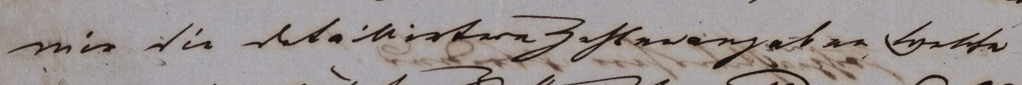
mir die detailliertern Zahlenangaben, welche
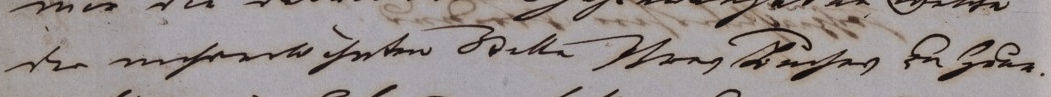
der mehrerwähnten Stelle Ihres Buches zu Grun-
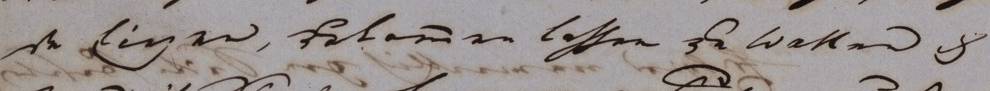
de liegen, zukommen lassen zu wollen &
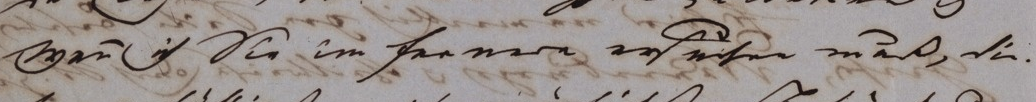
wenn ich Sie im fernern ersuchen muß, die-
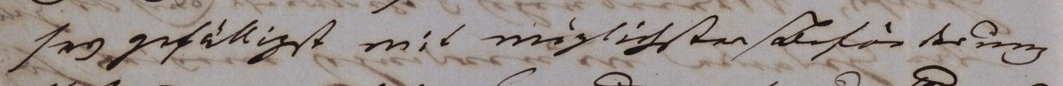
ses gefälligst mit möglichster Beförderung
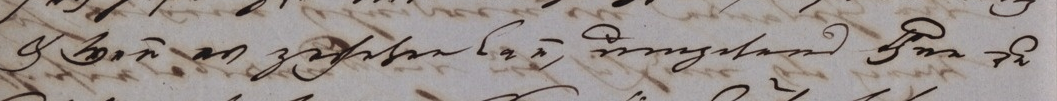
& wenn es geschehen kann, umgehend thun zu
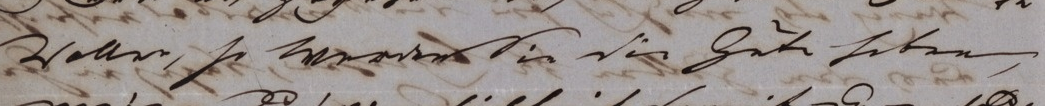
wollen, so werden Sie die Güte haben,
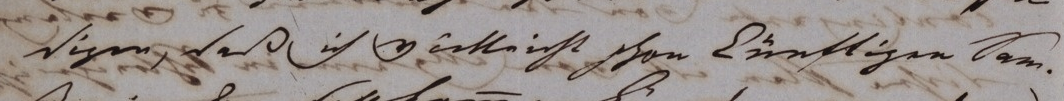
digen, daß ich vielleicht schon künftigen Sam-
